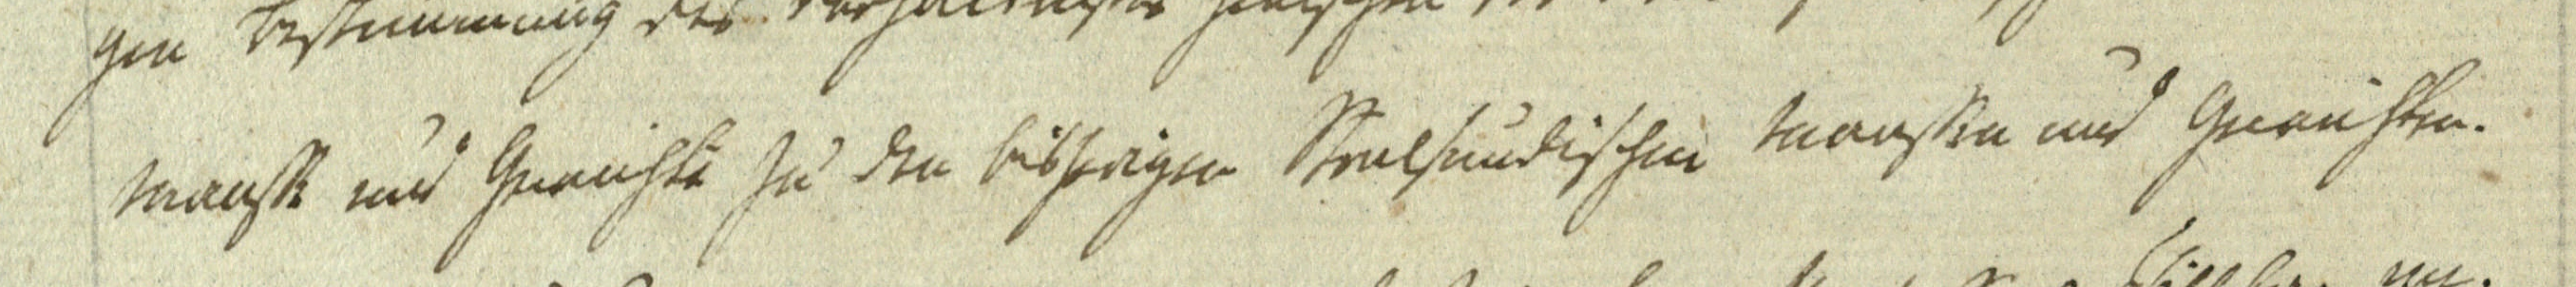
Maasse und Gewichte zu den bisherigen Stralsundischen Maassen und Gewichten.
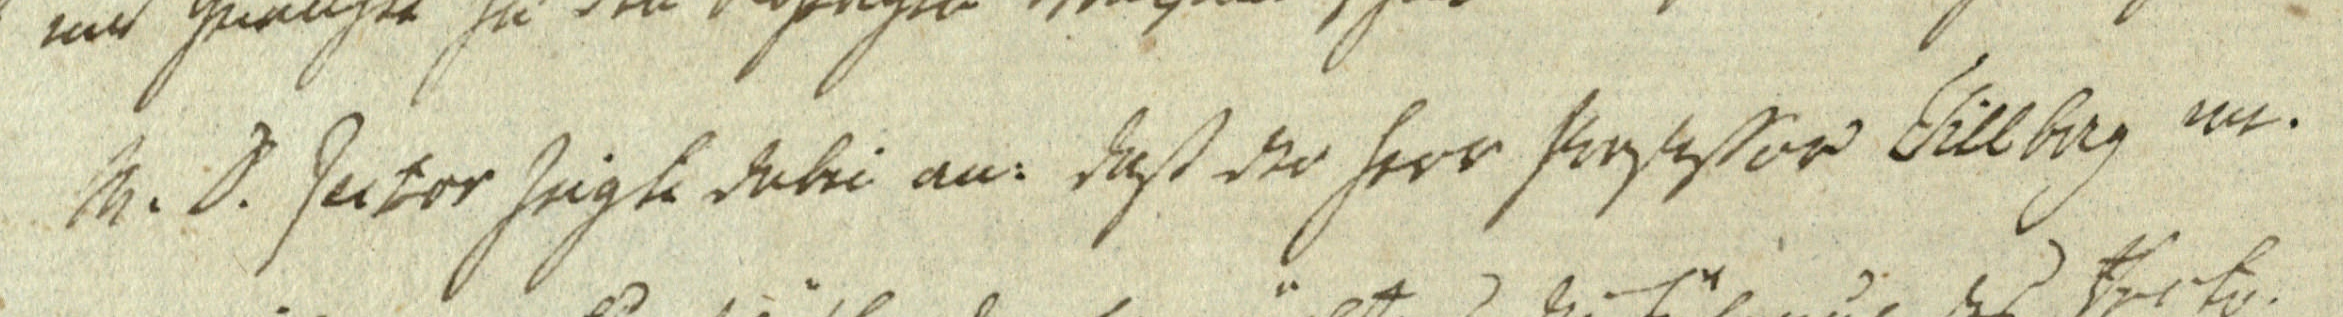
M. D. Rector zeigte dabei an, daß der Herr Professor Tillberg we¬
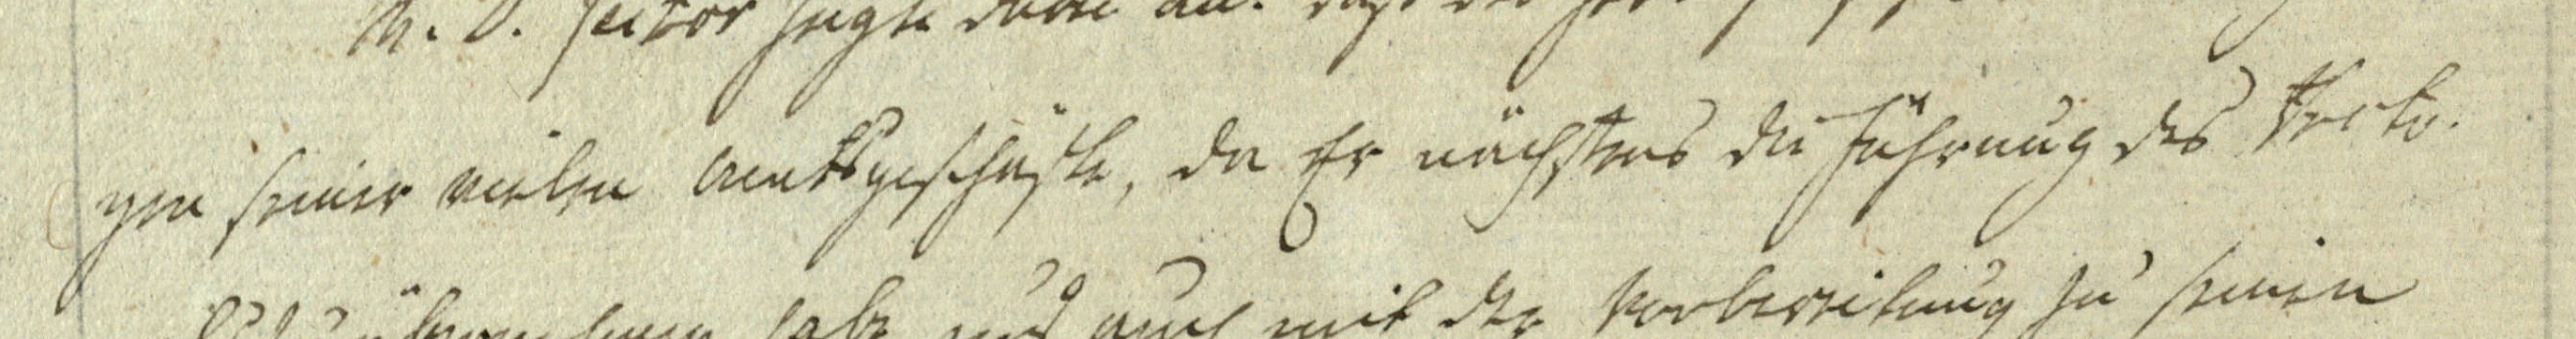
gen seiner vielen Amtsgeschäfte, da Er nächstens die Führung des Recto¬
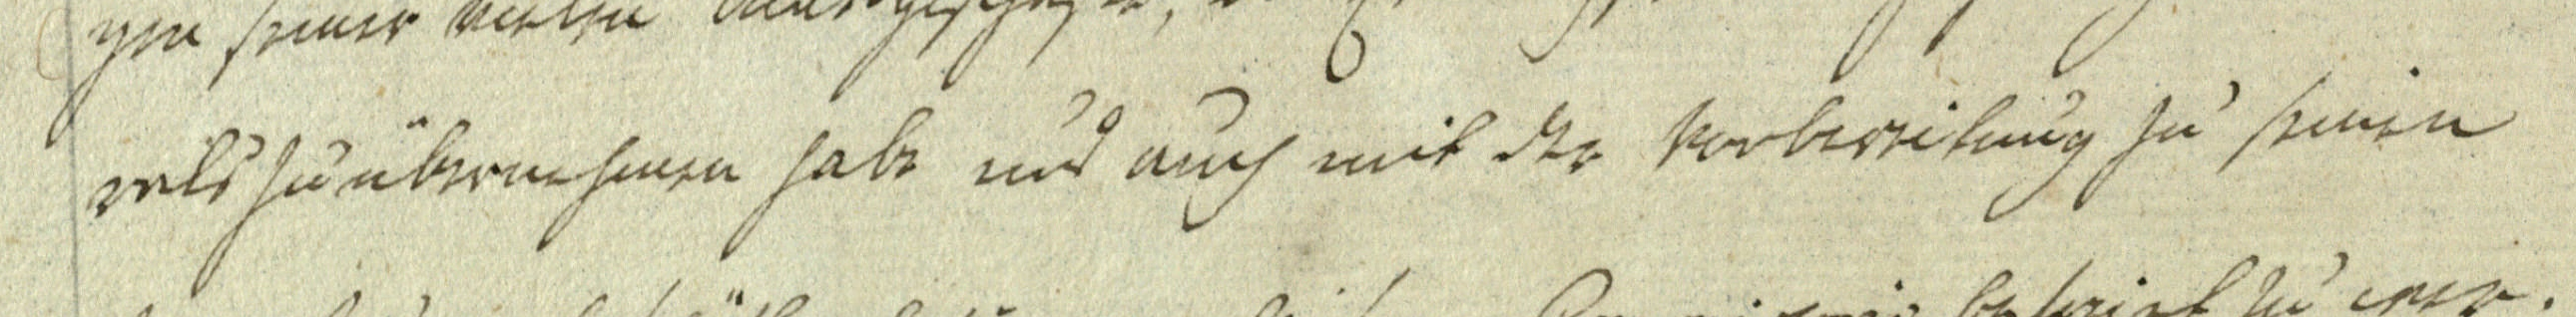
rats zu übernehmen habe und auch mit der Vorbereitung zu seinen
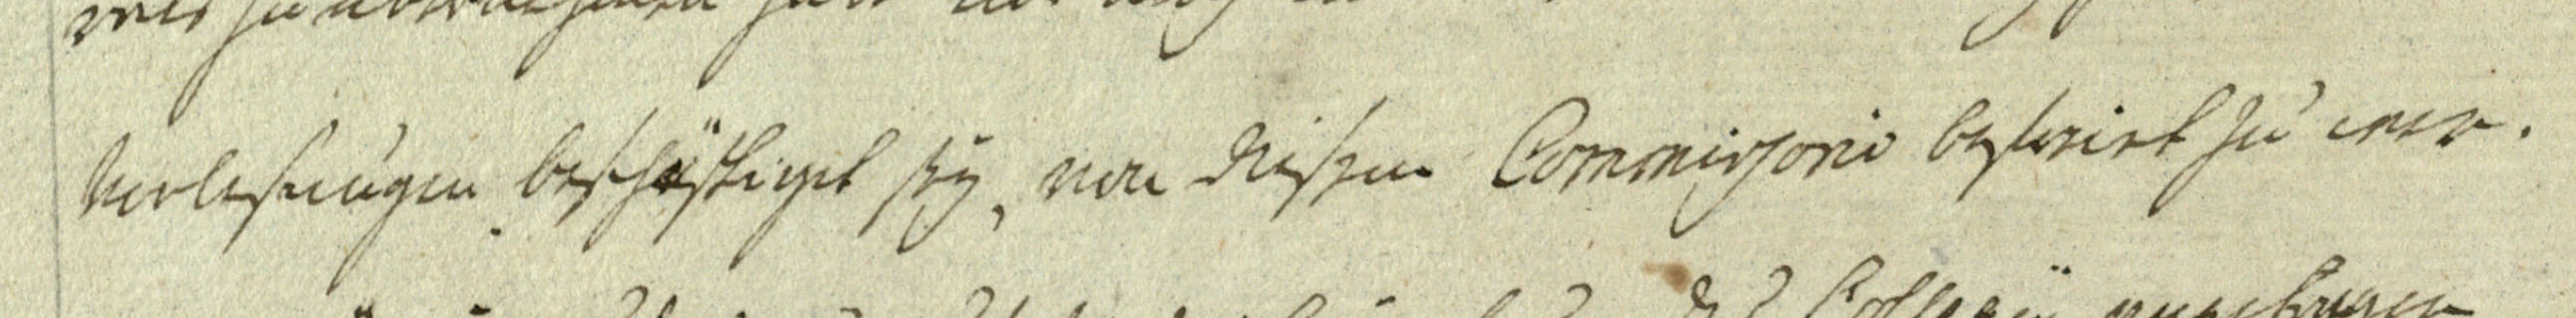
Vorlesungen beschäftiget seÿ, von diesem Commissorii befreiet zu wer¬
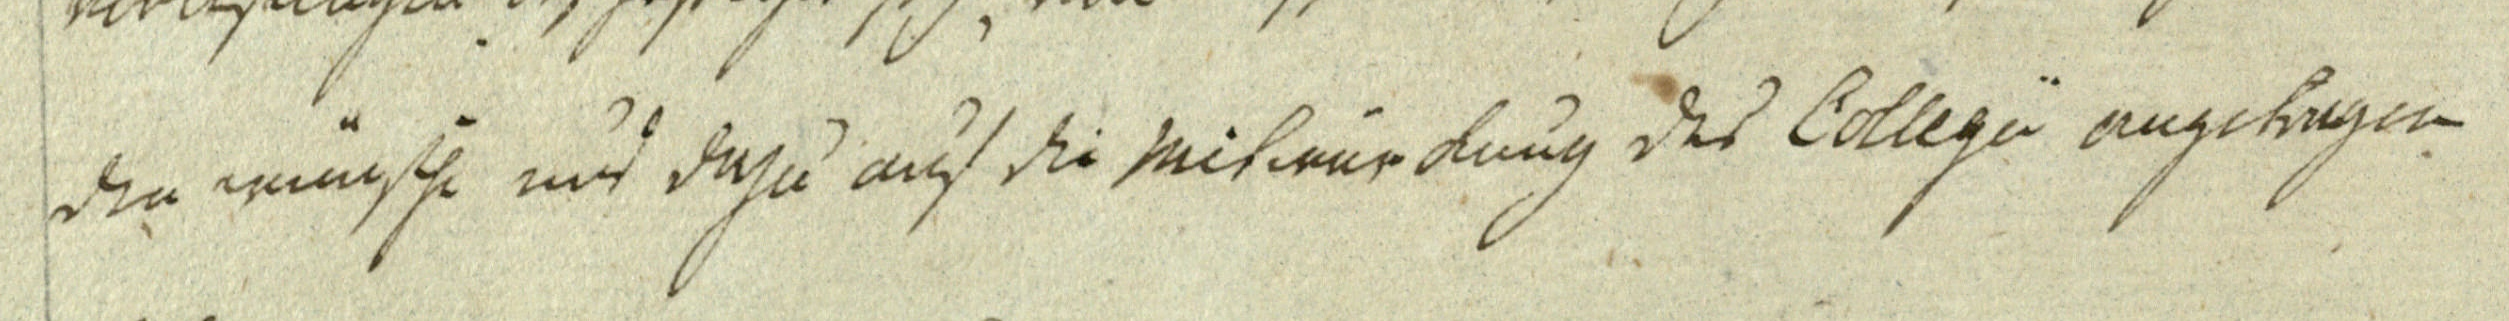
die wünsche und dazu auf die Mitwürkung des Collegii angetragen
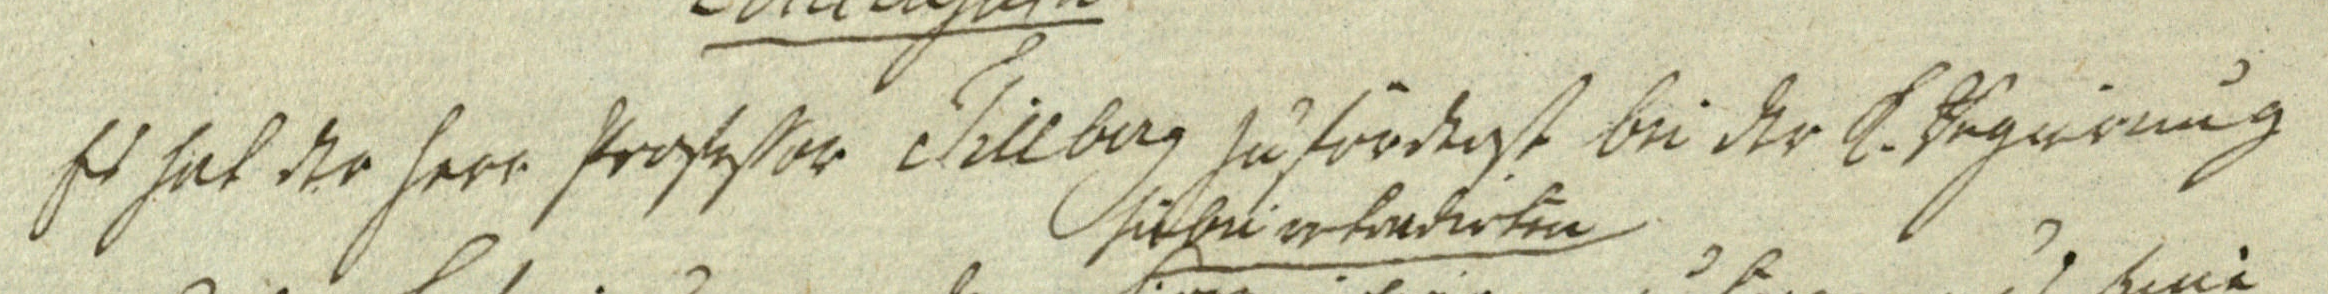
Es hat der Herr Professor Tillberg zuförderst bei der K. Regierung
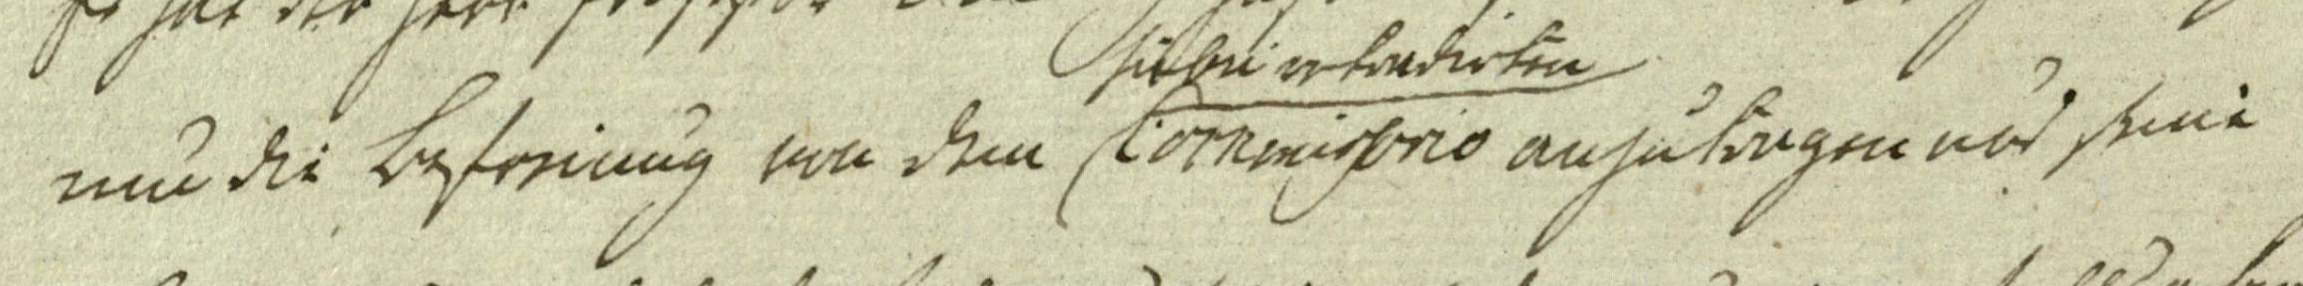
um die Befreiung von dem Commissorio anzutragen und seine
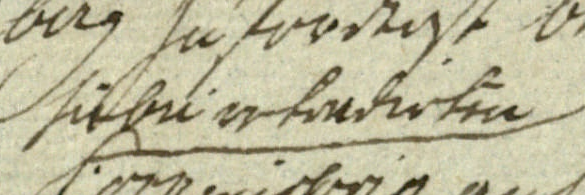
hiebei retradirten
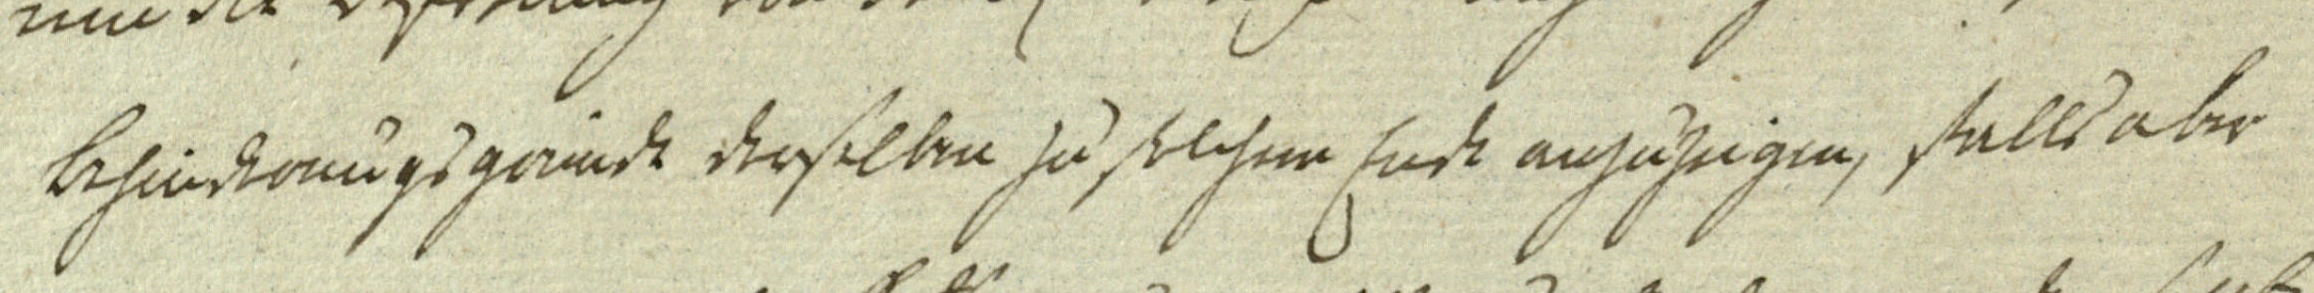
Behinderungsgründe derselben zu solchem Ende anzuzeigen, falls aber
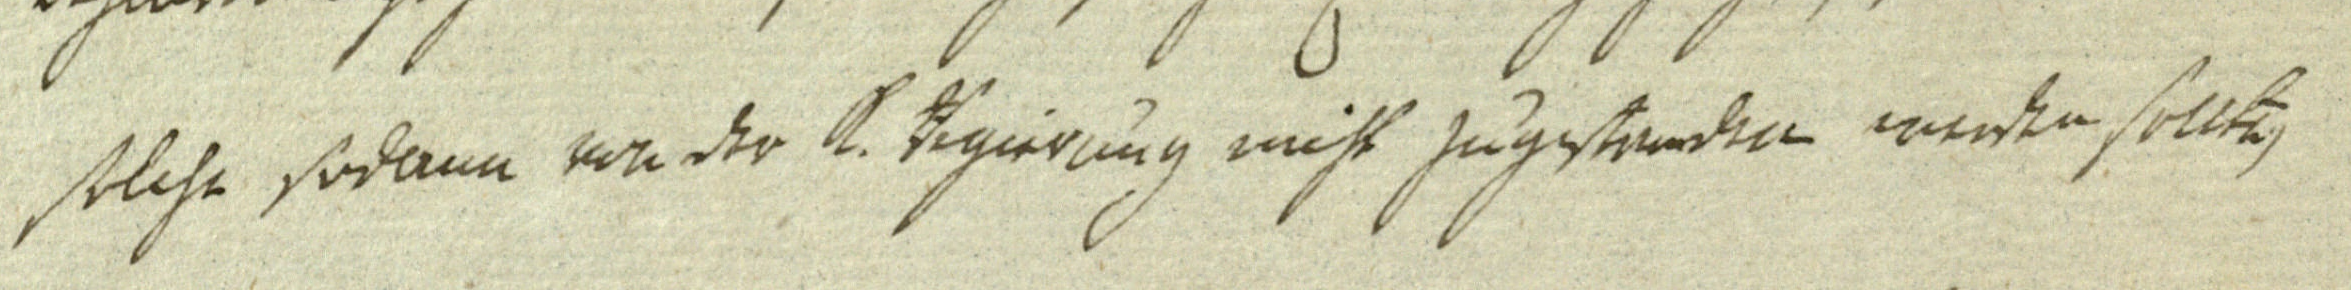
solche sodann von der K. Regierung nicht zugestanden werden sollte,
